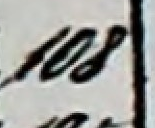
108
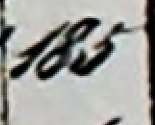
185
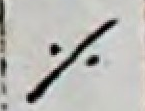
./.
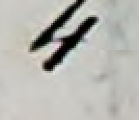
4
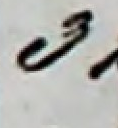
3
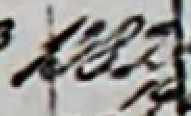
1282,6
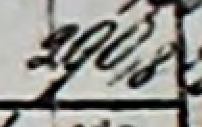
290,8
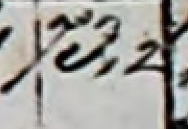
73,2
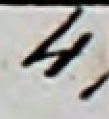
4
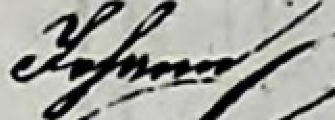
Johann
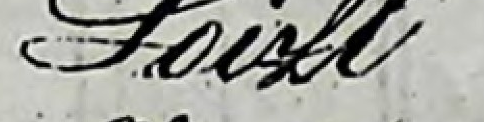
Loizl
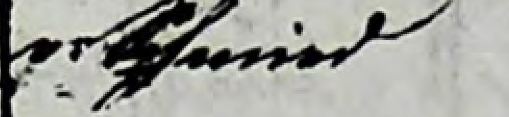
v. Schmied
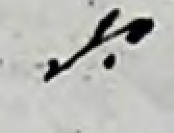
Do
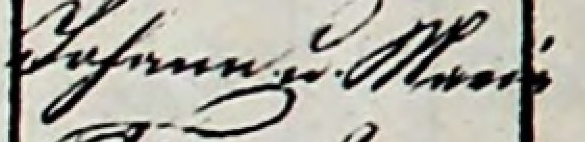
Johann u. Maria
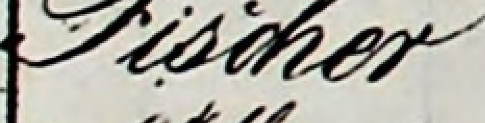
Fischer
